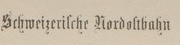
Schweizerische Nordostbahn
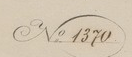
Direction.
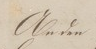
An den
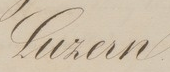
Luzern
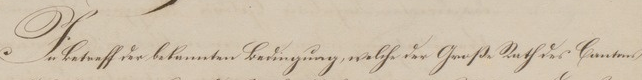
In Betreff der bekannten Bedingung, welche der Große Rath des Cantons
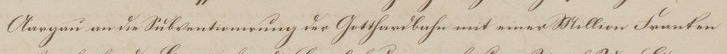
Aargau an die Subventionierung der Gotthardbahn mit einer Million Franken
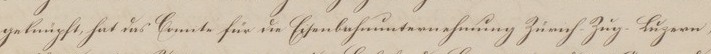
geknüpft, hat das Comite für die Eisenbahnunternehmung Zürich–Zug–Luzern,
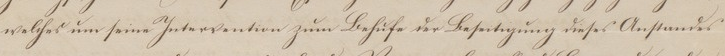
welches um seine Intervention zum Behufe der Beseitigung dieses Anstandes
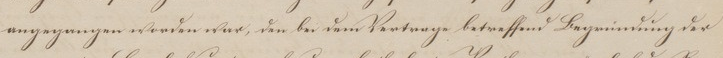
angegangen worden war, der bei dem Vertrage betreffend Begründung der
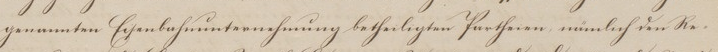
genannten Eisenbahnunternehmung betheiligten Partheien, nämlich der Re-
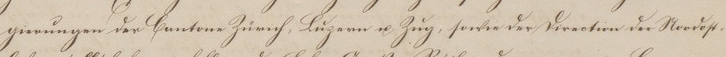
gierungen der Cantone Zürich, Luzern & Zug, sowie der Direction den Nordost-
